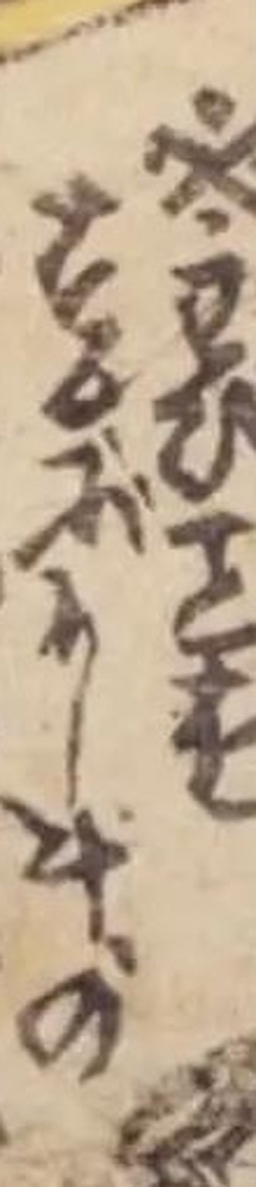するにかしまの
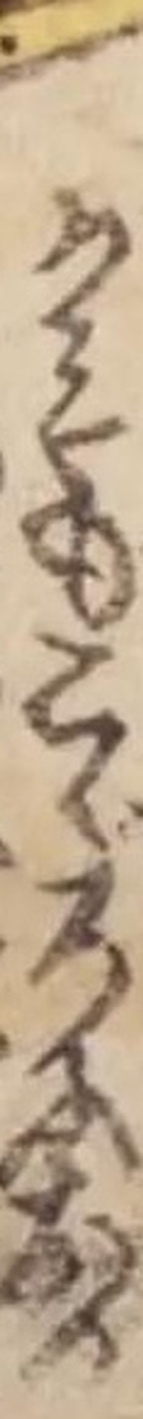かみもこゝろにおか
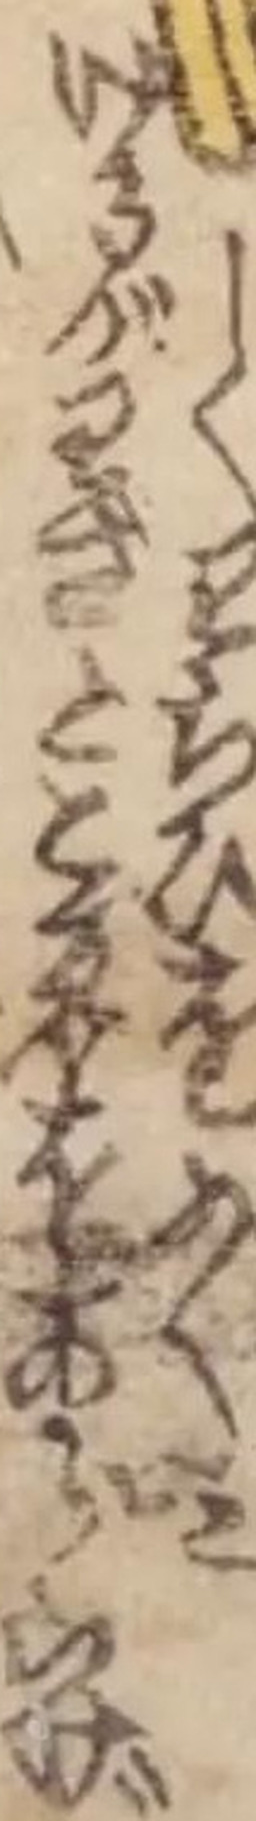けるがわざとこゑをあららげ
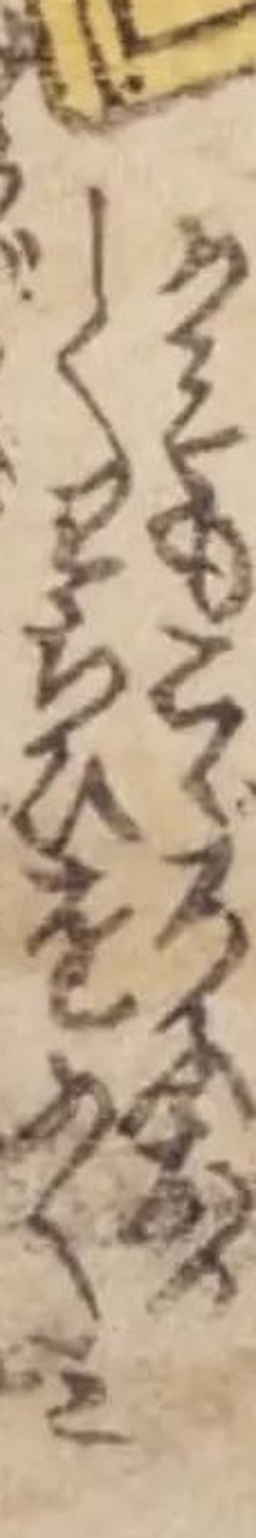しくわらひをふくみ
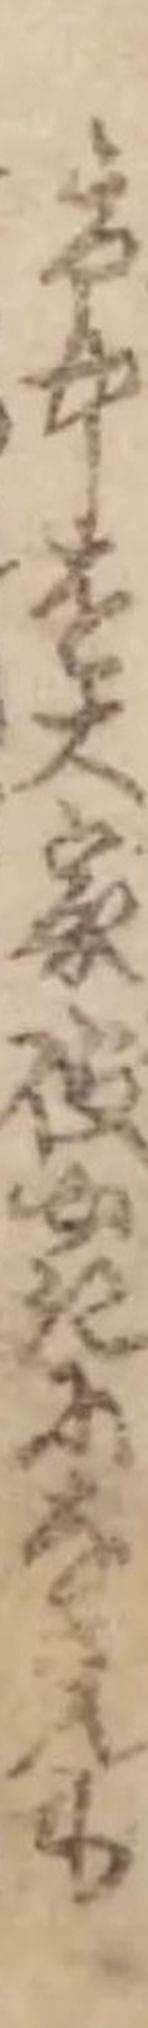市中を大家破やきになさんも
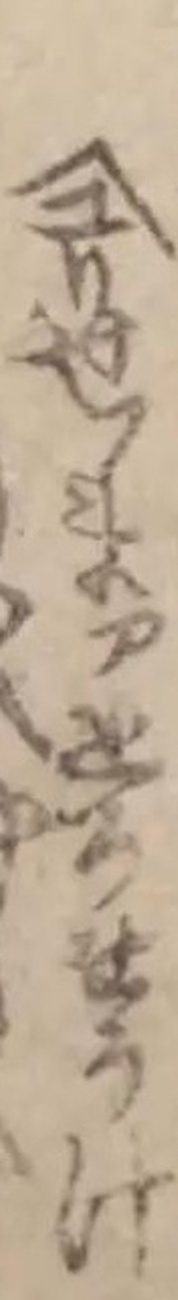「ユリせまアとろせう汁
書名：生捕ました三度の大地震
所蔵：国立国会図書館 National Diet Library, JAPAN
